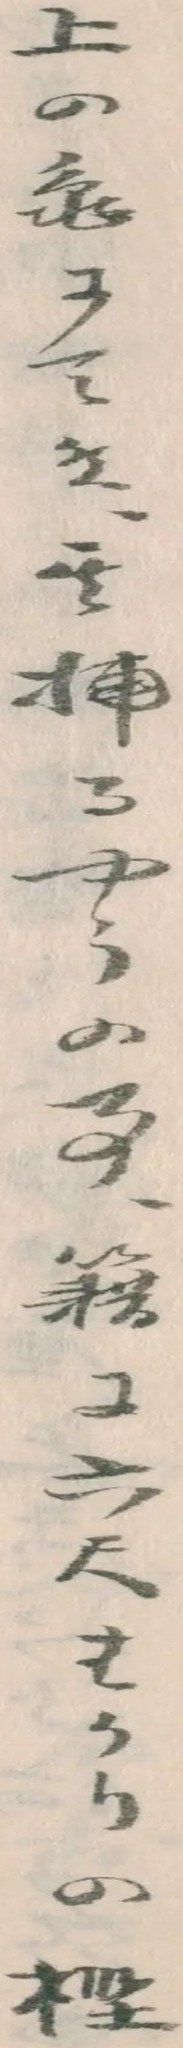上の亀にて候、其捕るやうの事、籍に六尺はかりの樫
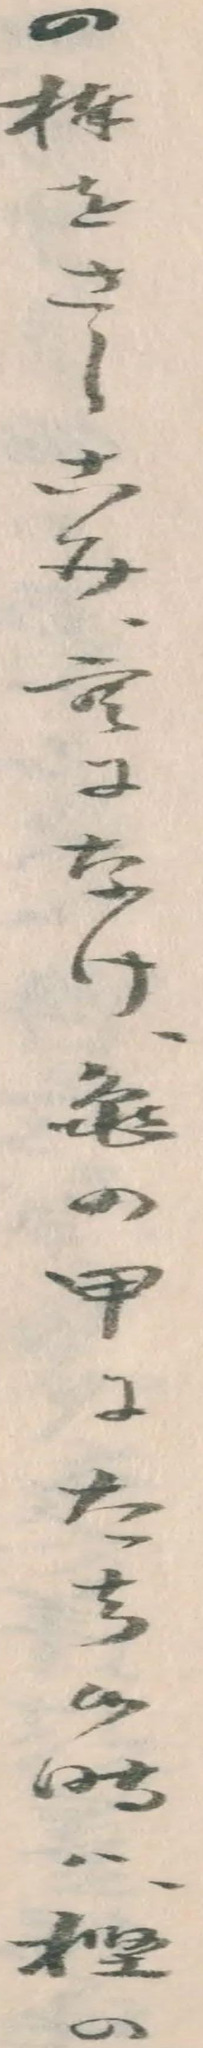の棒をさしこみ、空になけ、亀の甲にたち候時は、樫の
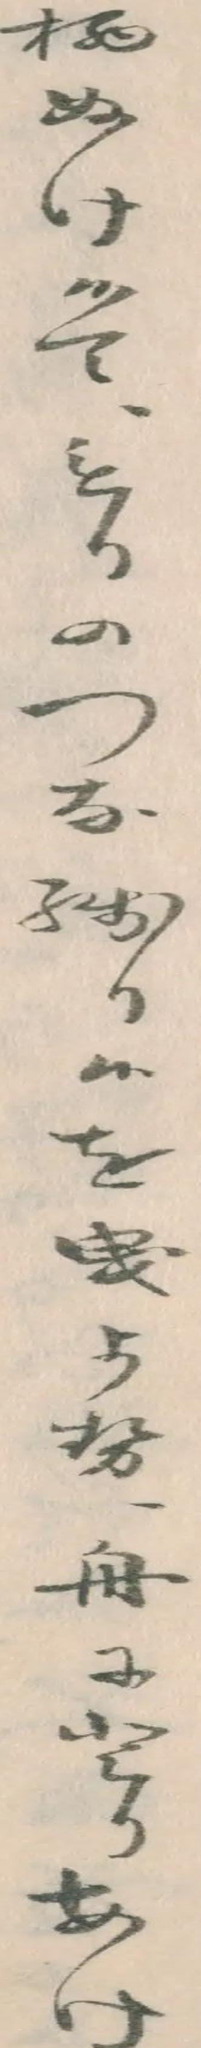柄ぬけ候て、もりのつな残り候を曳よせ、舟にとりあけ

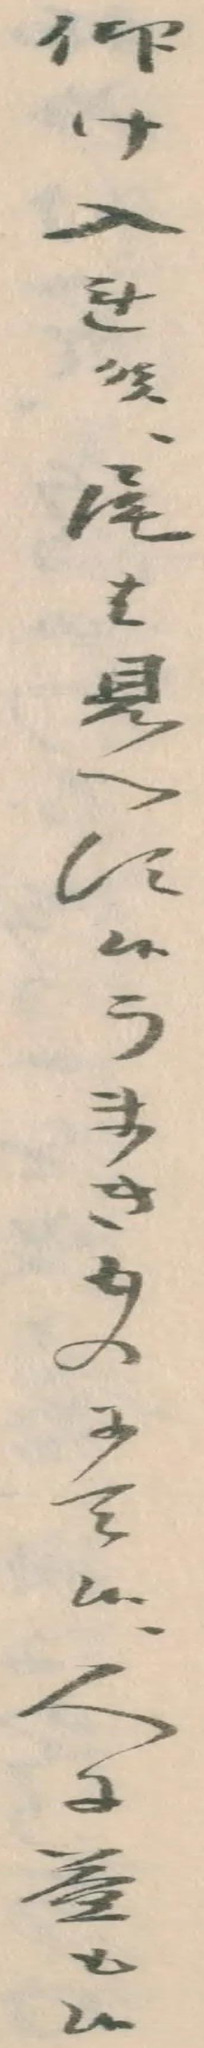仰け入れ候、尾は見へす候うまきものにて候、人に益も候
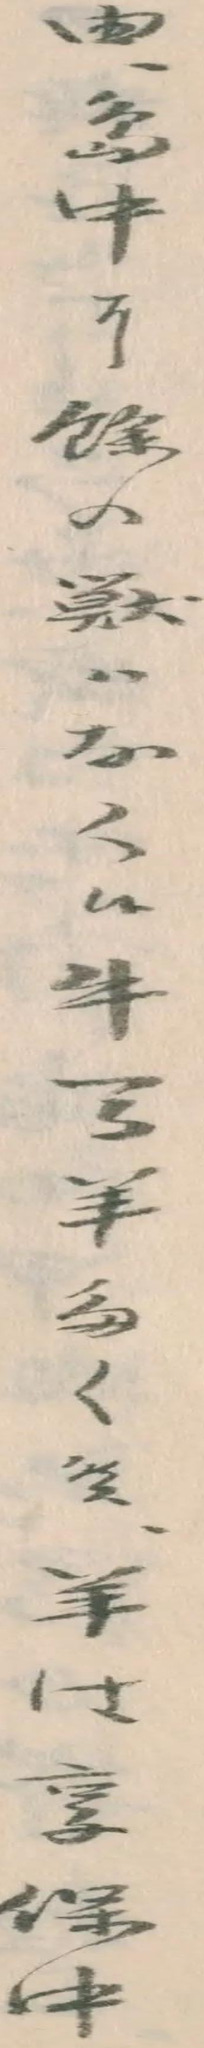由、島中に余の獣はなく候牛馬羊多く候、羊は享保中
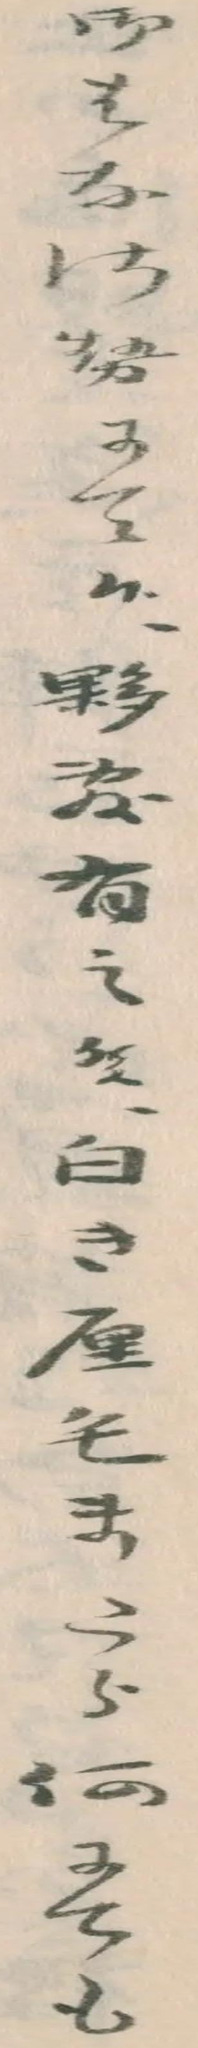御はなさせにて候、夥敷有之候、白き厘毛まだら何にても
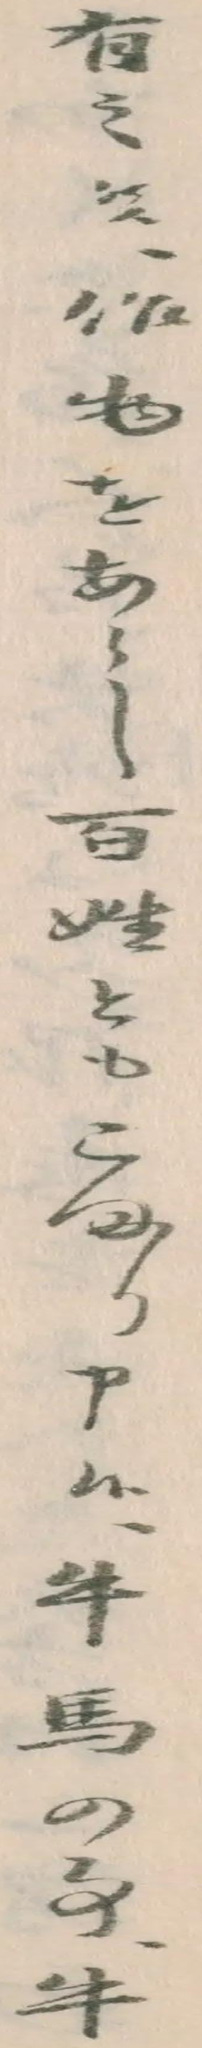有之候、作物をあらし百姓ともこまり申候、牛馬の事、牛
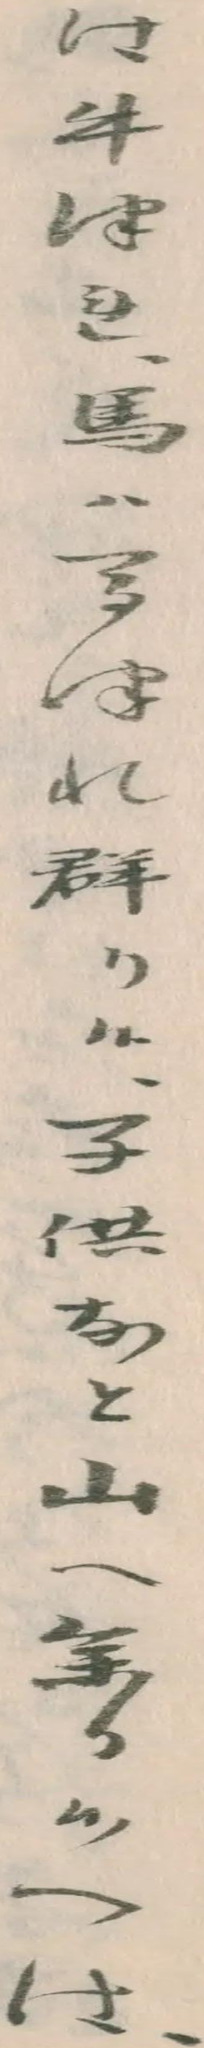は牛つれ、馬は馬つれ群り候、子供なと山へ参り候へは、
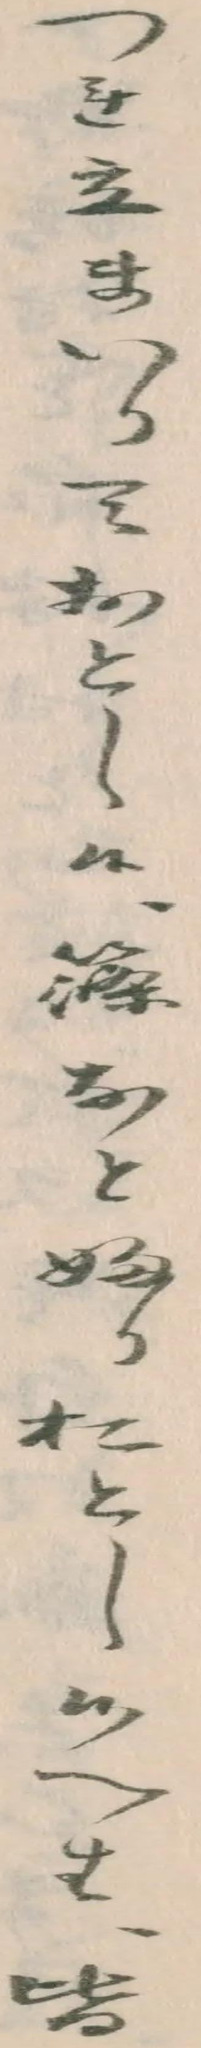つれ立まいりておとし候、篠なとふりおとし候へは、皆
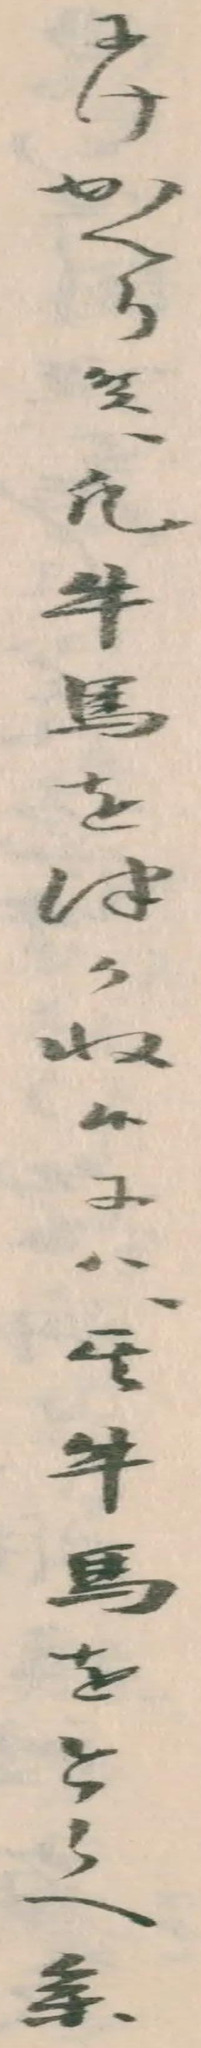にけかへり候、凡牛馬をつかね候には、其牛馬をとらへ参
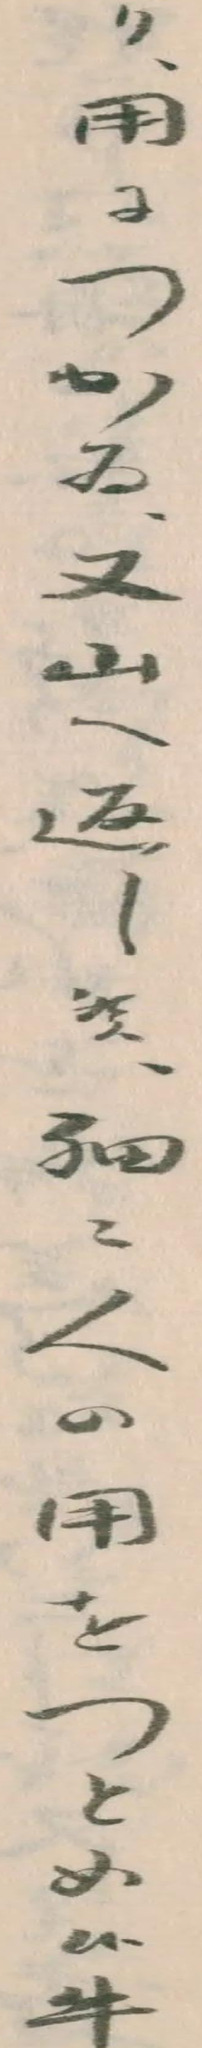り、用につかゐ、又山へ返し候、細々人の用をつとめ候牛
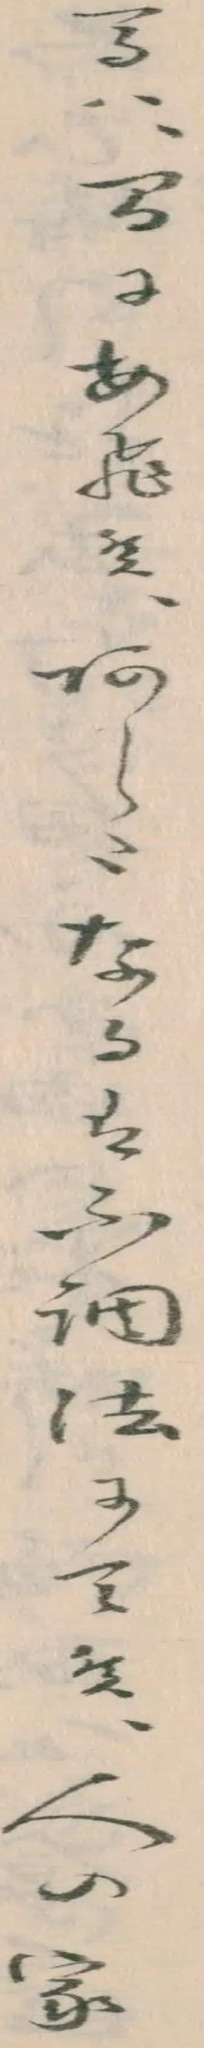馬は、間にあひ候、あしたなるは不調法にて候、人の家
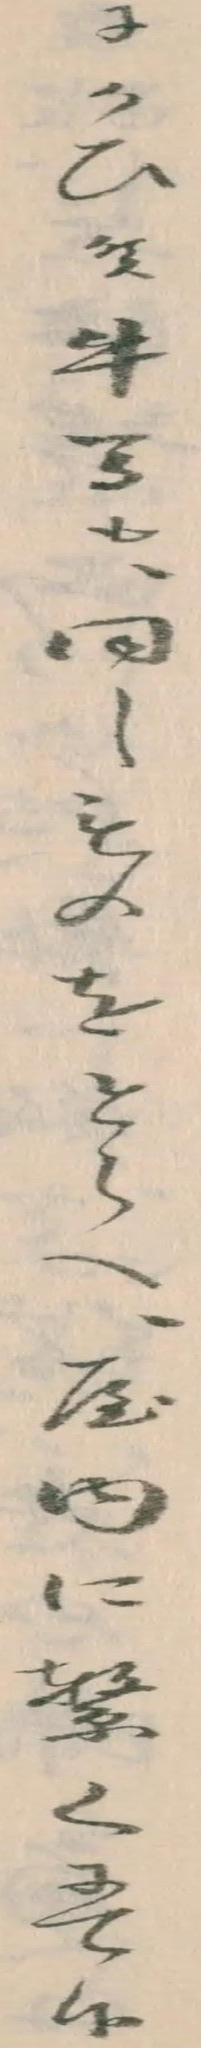にかひ候牛馬も、同しものをとらへ、屋内に繫ぐにて候
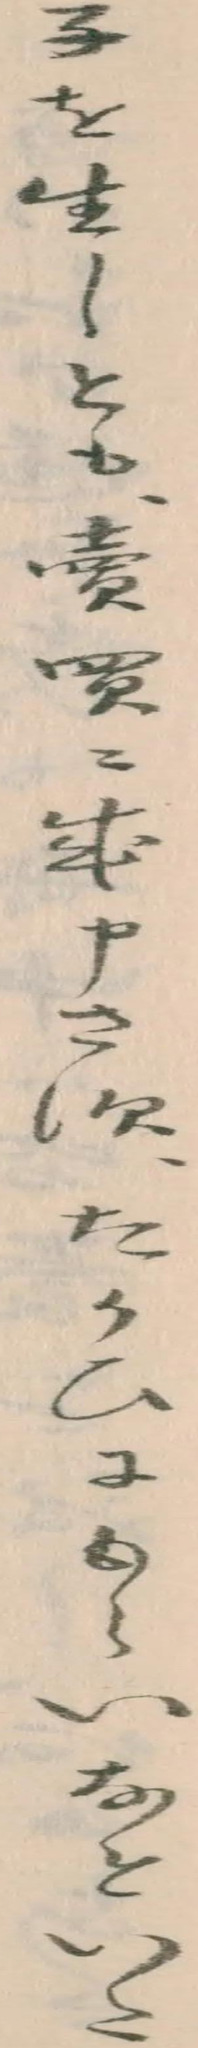子を生しとも、売買に成申さす、たかひにもらいなといた
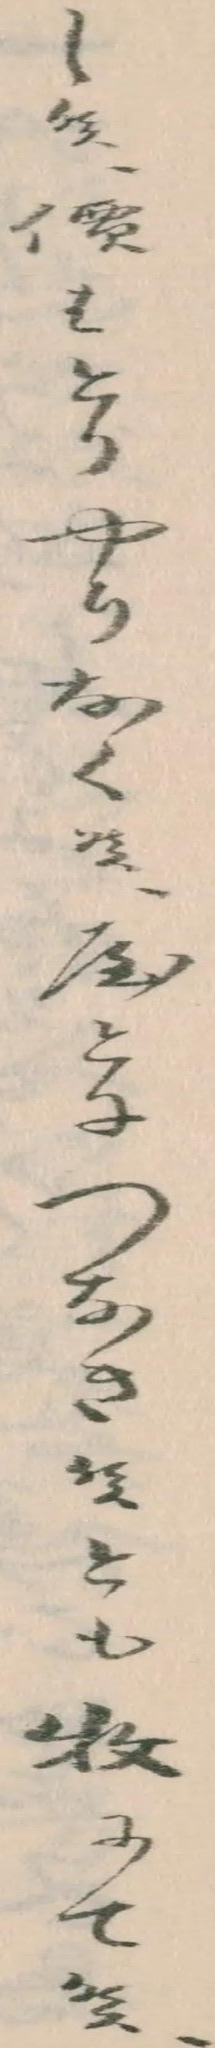し候、価はとりやりなく候、やとにつなき候とも牧にて候、
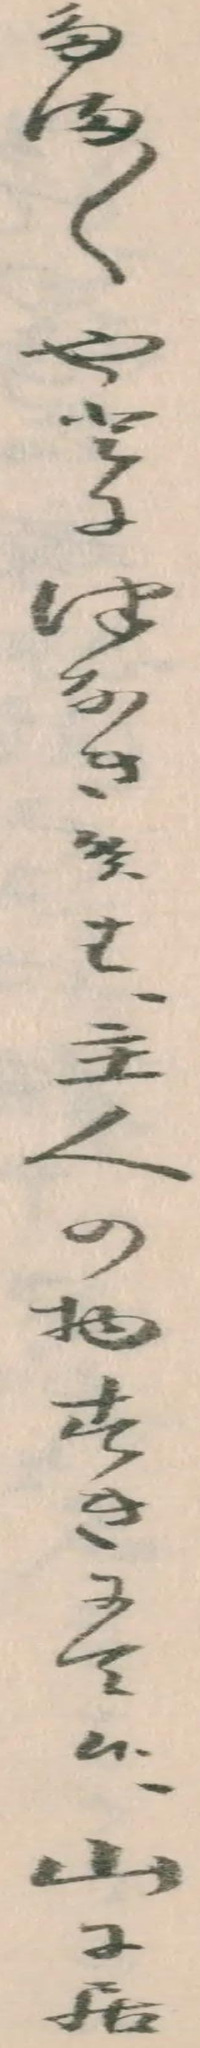たま〳〵やとにつなき候は、主人の物すきにて候、山に居
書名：地災撮要. 巻11-12(地震之部)
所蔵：国立国会図書館 National Diet Library, JAPAN
